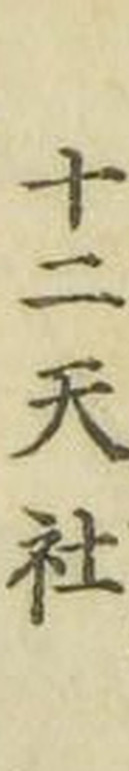十二天社

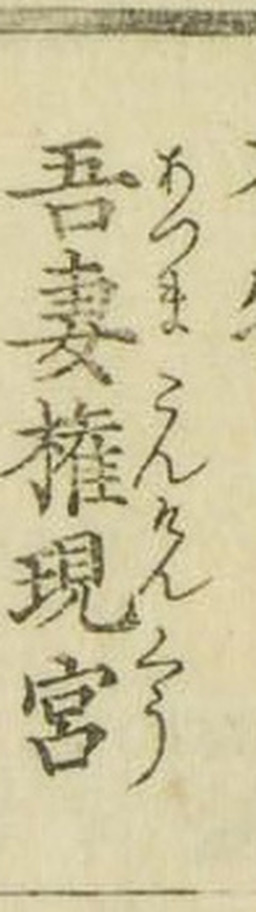吾妻権現宮

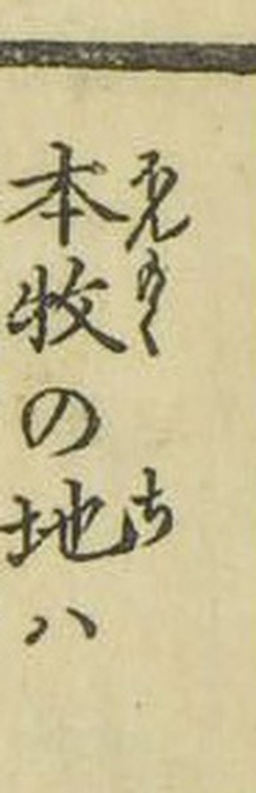本牧の地ハ
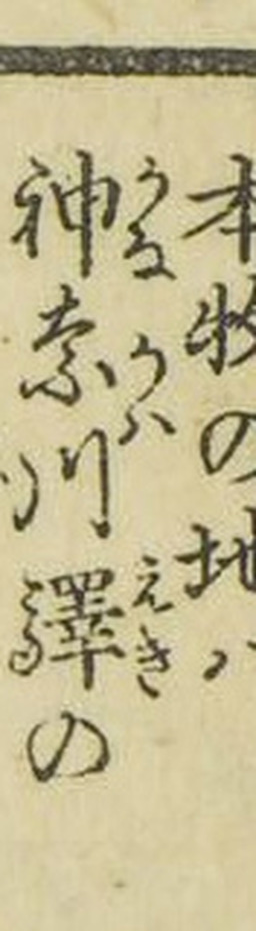神奈川驛の
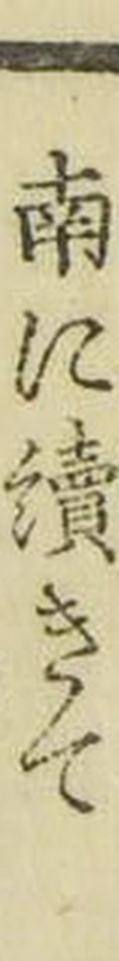南に續きて
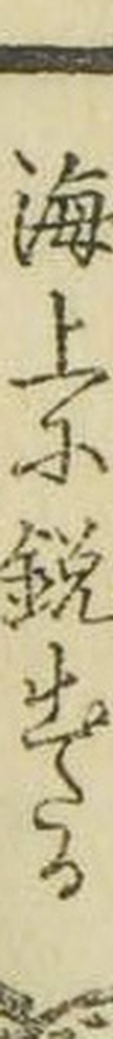海上に鋭出たる
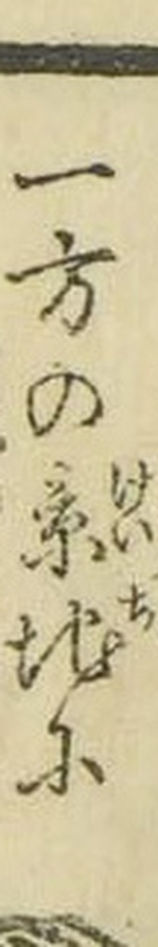一方の景地に
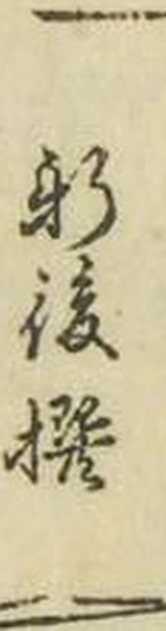新後撰
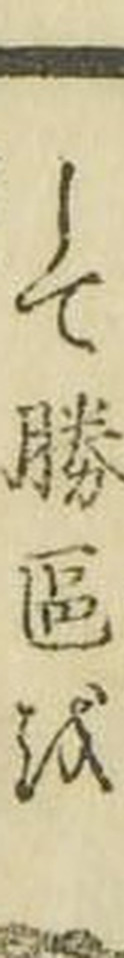いて勝區を
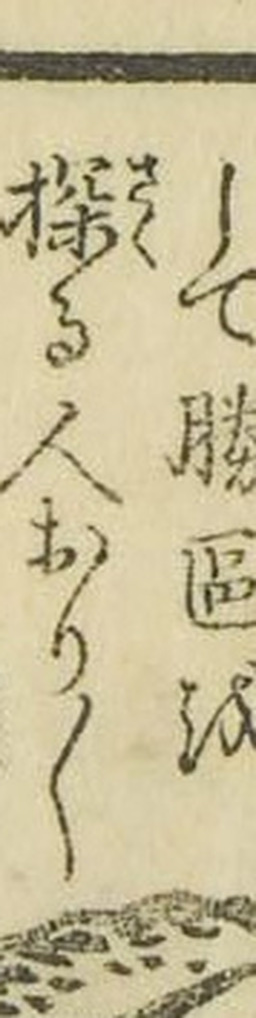探る人おり〳〵
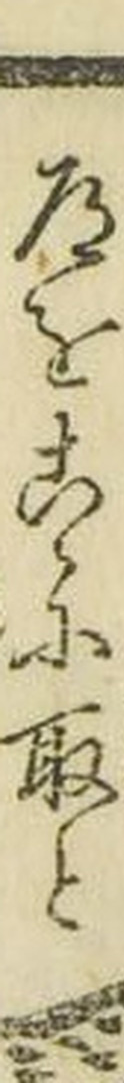道をこゝに取と
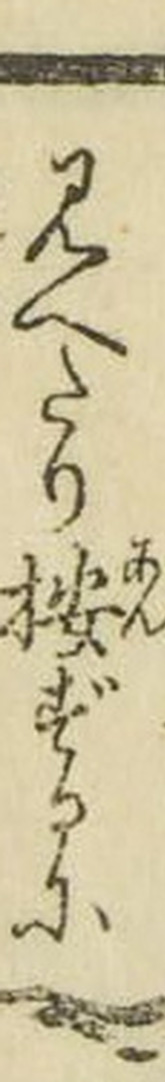見へたり按ずるに
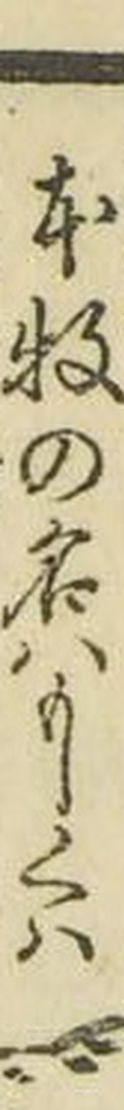本牧の名はもしくは
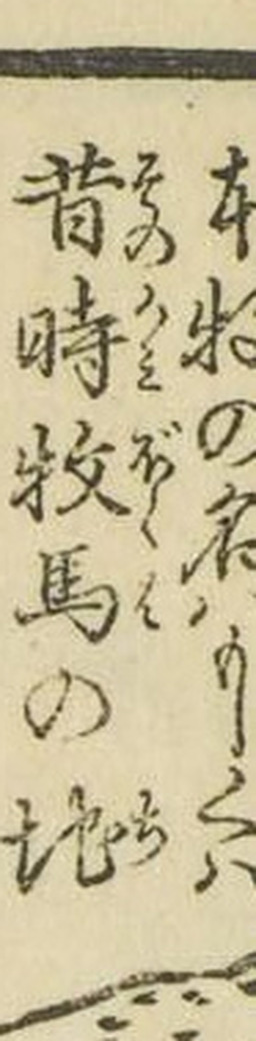昔時牧馬の地
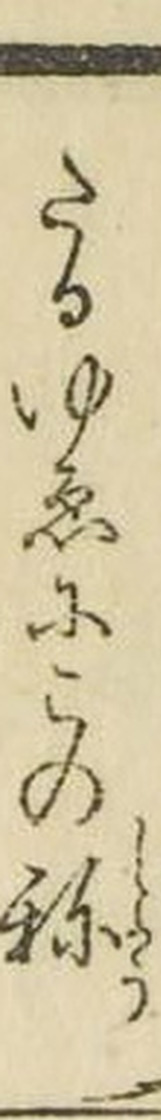たるゆゑにこの称
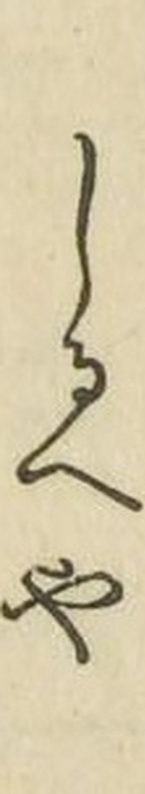しるへや
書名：江戸名所図会 20巻 巻之6
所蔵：東京学芸大学教育コンテンツアーカイブ
